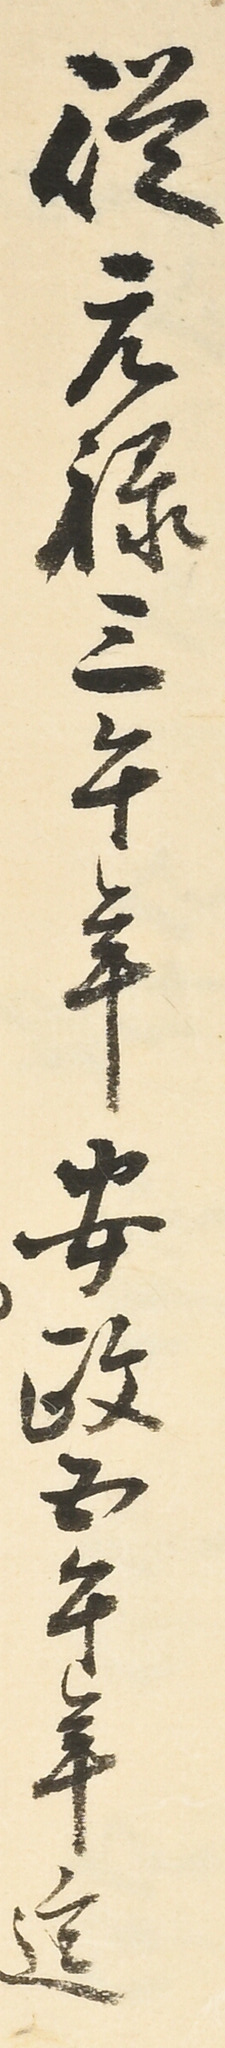従元禄三午年安政五午年迄
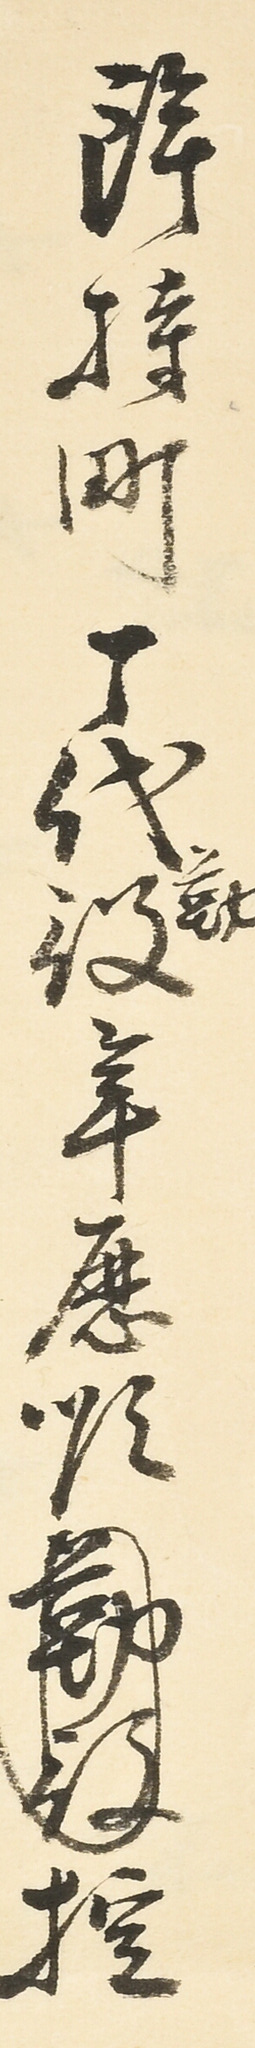鉾持町丁代役年歴順勤役控
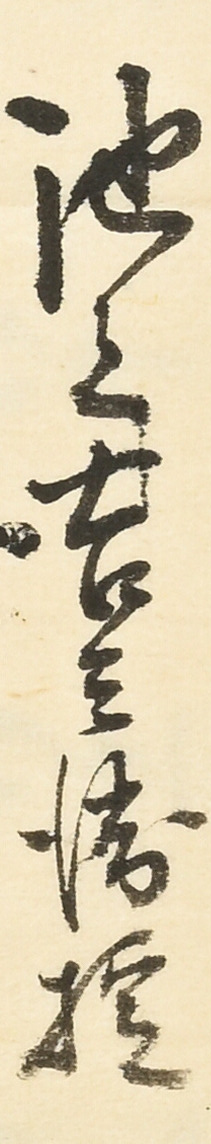池上吉兵衛控

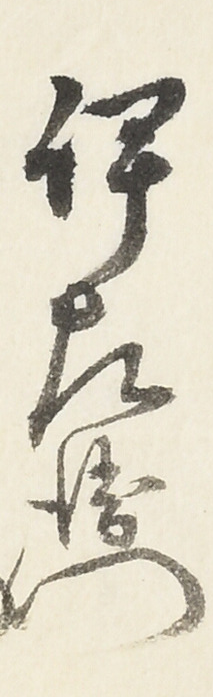仁左衛門
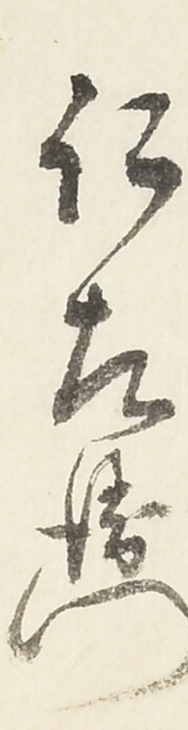仁左衛門
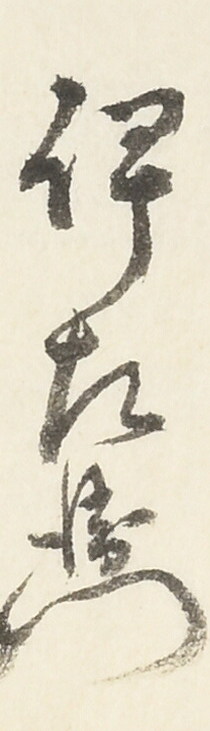仁左衛門
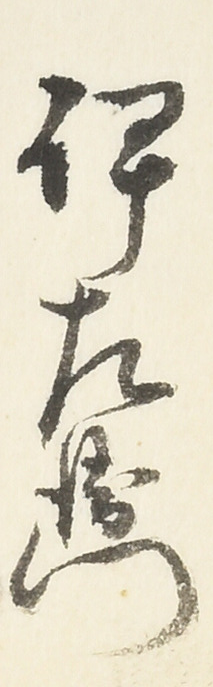仁左衛門
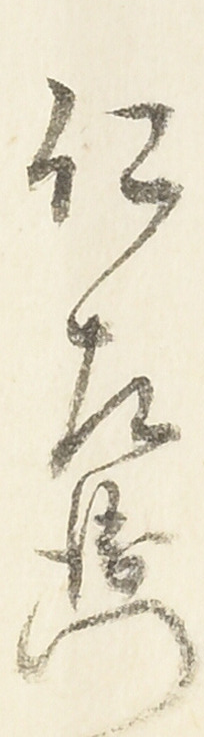仁左衛門
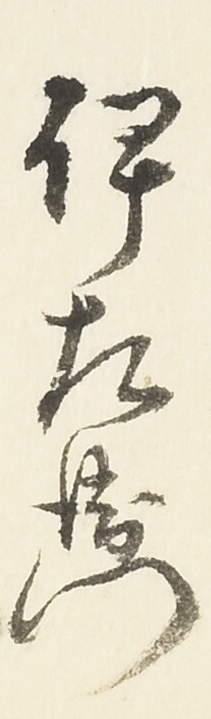仁左衛門
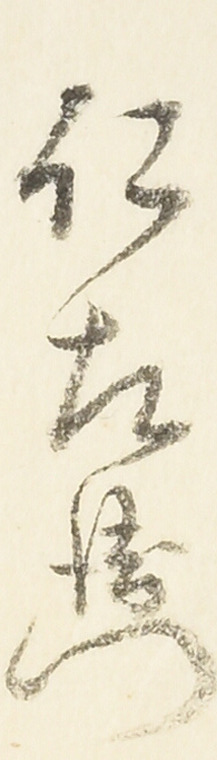仁左衛門
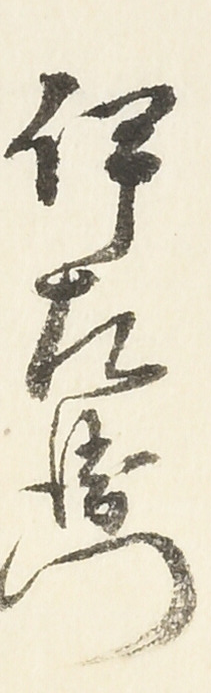仁左衛門
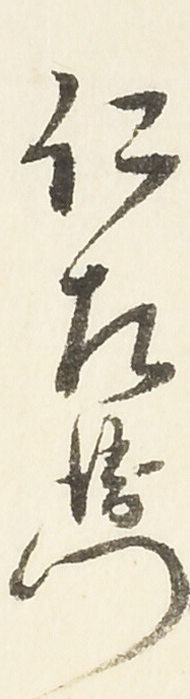仁左衛門
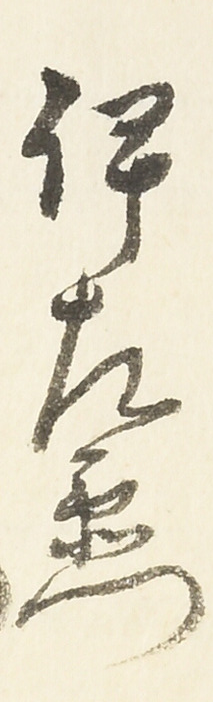仁左衛門
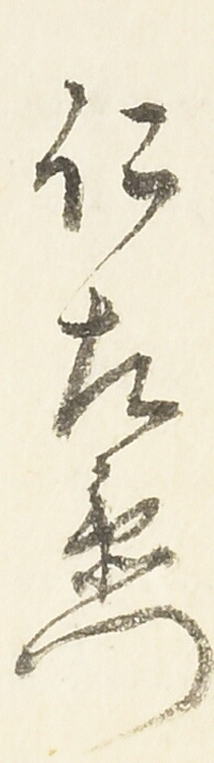仁左衛門
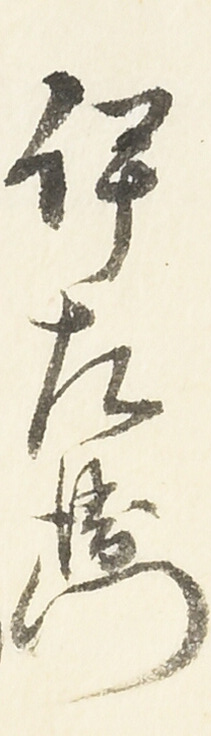仁左衛門
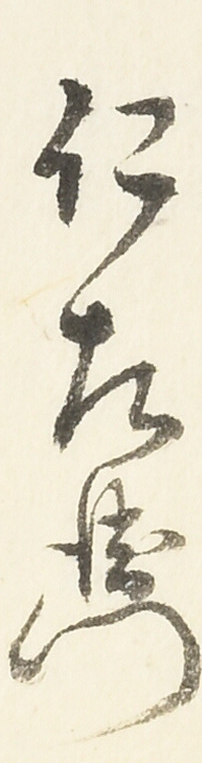仁左衛門
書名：鉾持町丁代勤役年歴順控
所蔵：伊那市立高遠町図書館・合同会社AMANE
